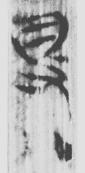𠭁
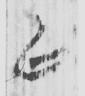㠯（以）
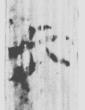亓
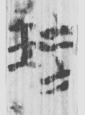珪
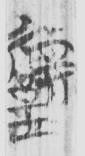璧
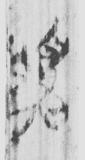嘉
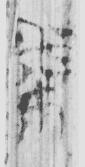㡀
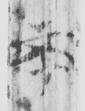不
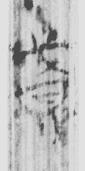貣
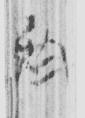於
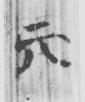亓
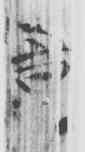{之日}
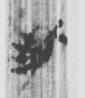此
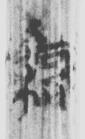紿
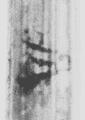之
